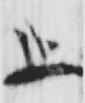之
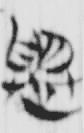○（舉）
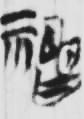禱
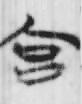宮
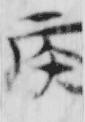矦（后）
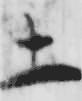土
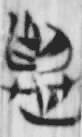○（舉）
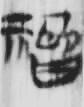禱
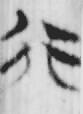行
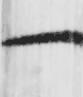一
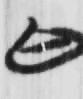白
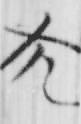犬
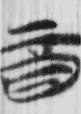酉
